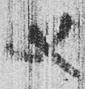又（有）
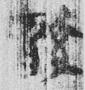○（絞）
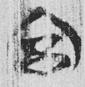宫
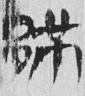○（弘）
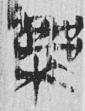喪
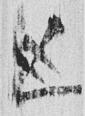之
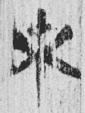末
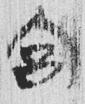宮
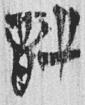訐（衍）
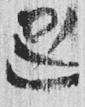疋（糈）
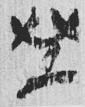○（供）
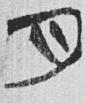月
